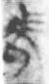○（虎）
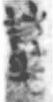○（貘）
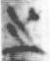之
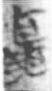聶（攝）
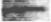一
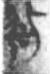紫
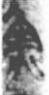魚
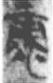彔（綠）
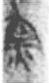魚
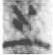之
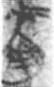○（箙）
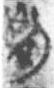○（絶）
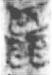聶（攝）
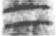二
